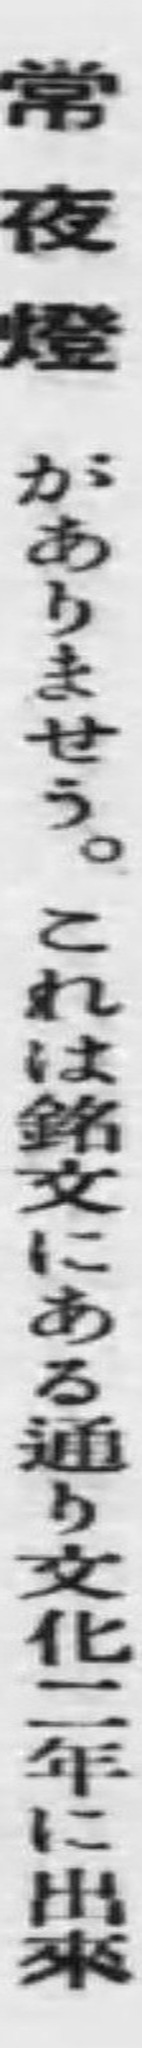常夜灯がありませう。これは銘文にある通り文化二年に出来
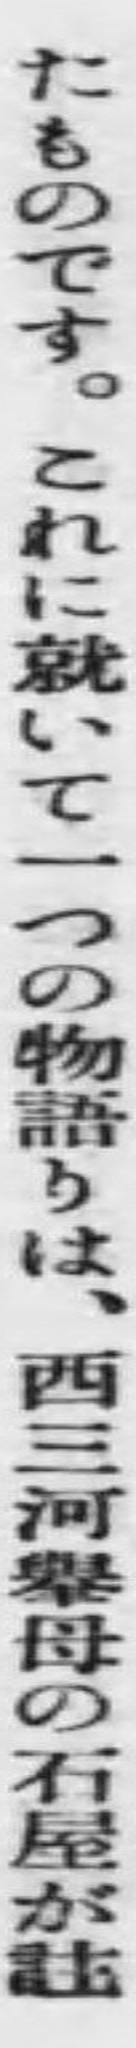たものです。これに就いて一つの物語りは、西三河挙母の石屋が註
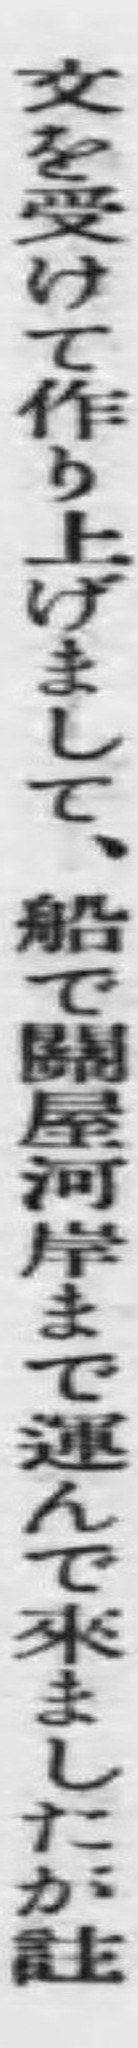文を受けて作り上げまして、船で関屋河岸まで運んで来ましたが註
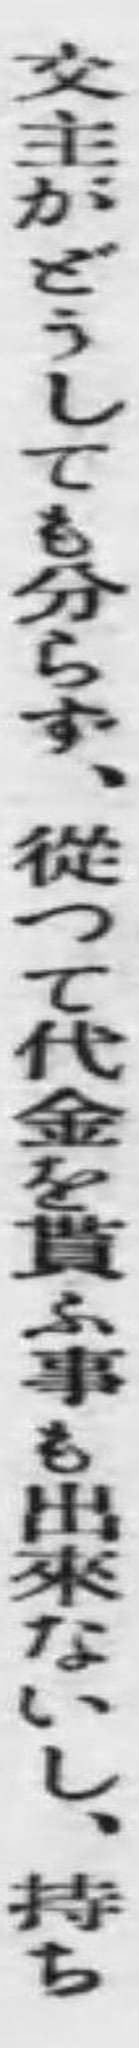文主がどうしても分らず、従つて代金を貰ふ事も出来ないし、持ち
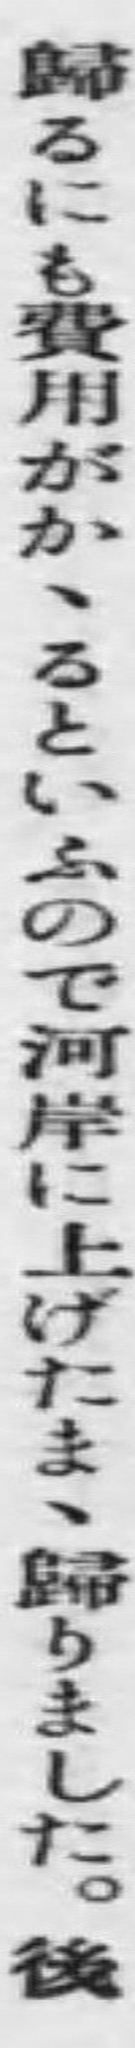帰るにも費用がかゝるといふので河岸に上げたまゝ帰りました。後
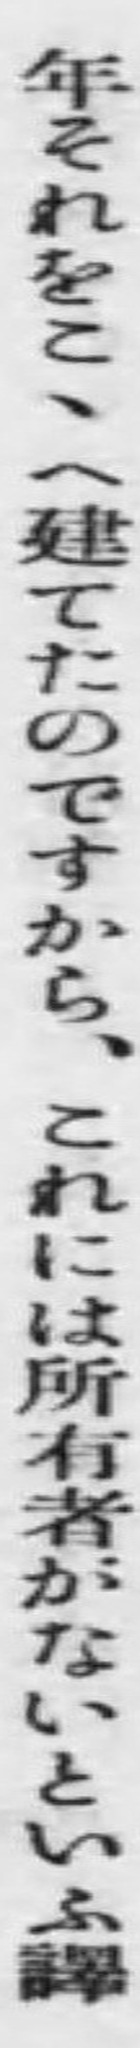年それをこゝヘ建てたのですから、これには所有者がないといふ訳
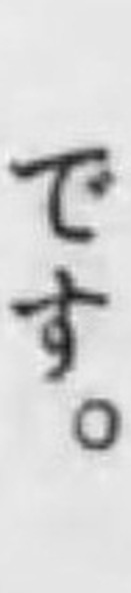です。
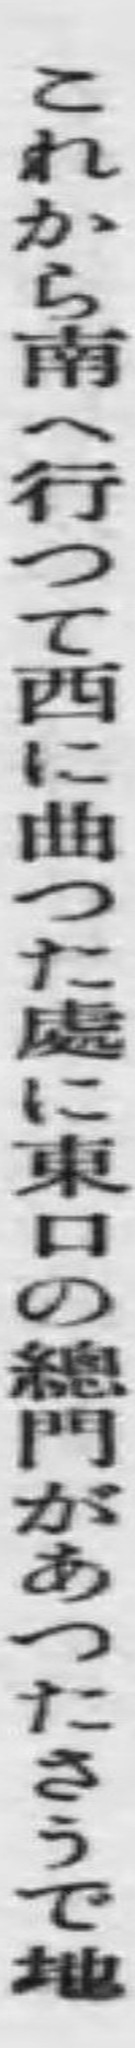これから南へ行つて西に曲つた処に東口の総門があつたさうで地
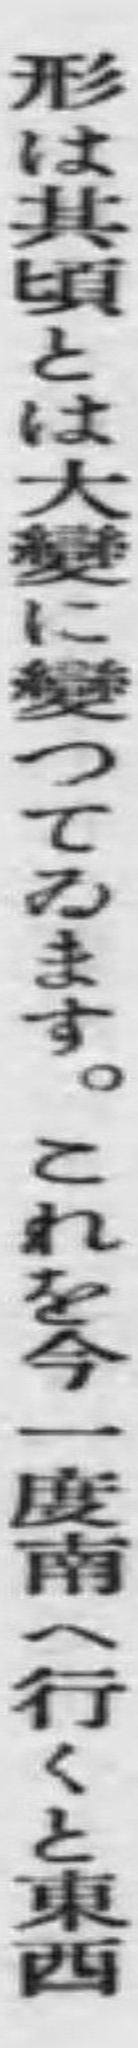形は其頃とは大変に変つてゐます。これを今一度南へ行くと東西
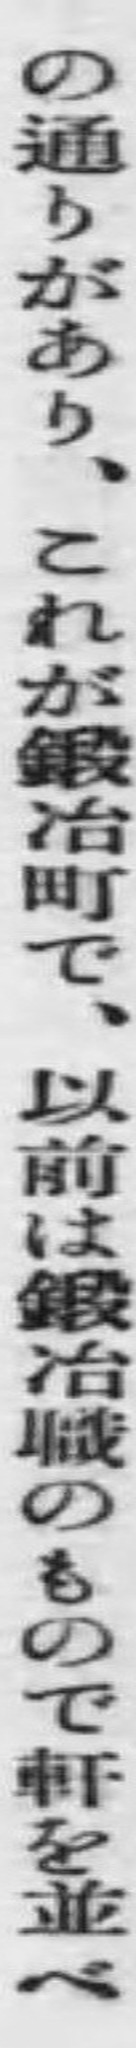の通りがあり、これが鍛冶町で、以前は鍛冶職のもので軒を並べ
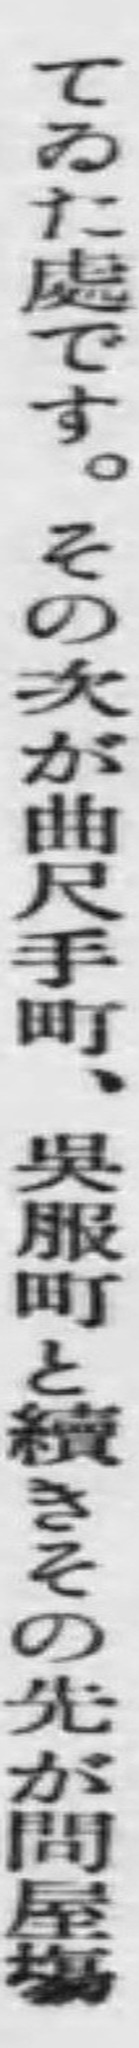てゐた処です。その次が曲尺手町、呉服町と続きその先が問屋場
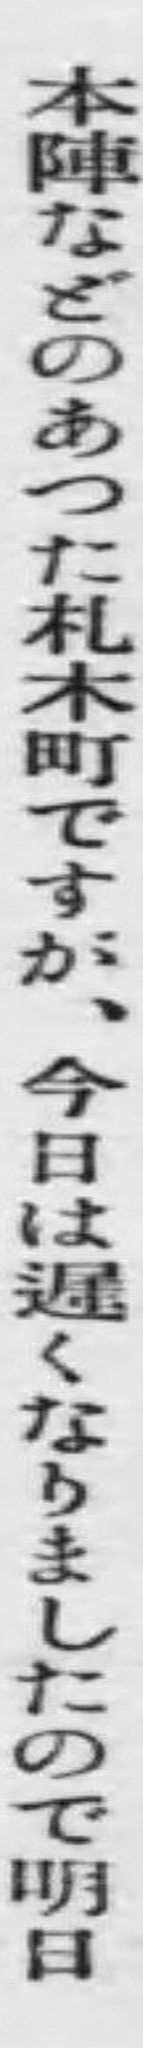本陣などのあつた札木町ですが、今日は遅くなりましたので明日
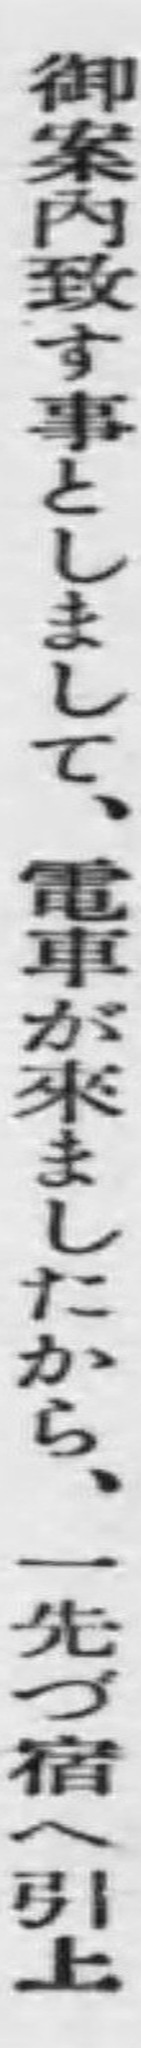御案内致す事としまして、電車が来ましたから、一先づ宿へ引上
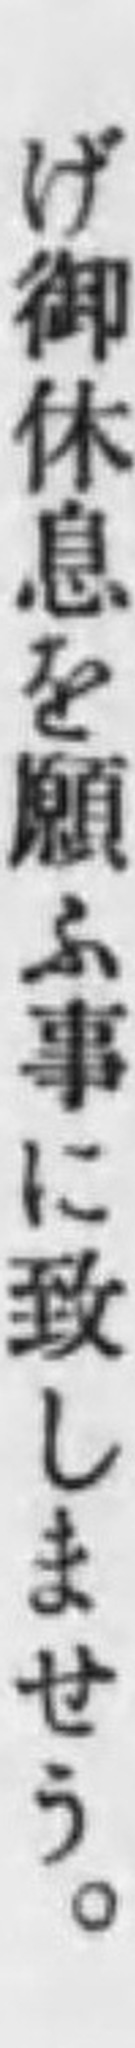げ御休息を願ふ事に致しませう。
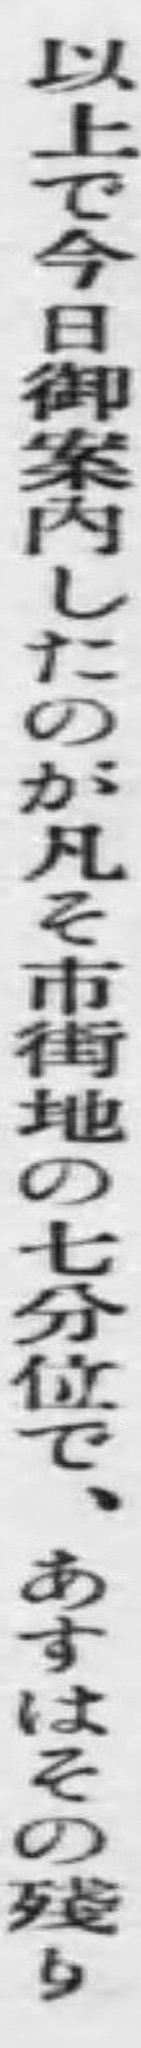以上で今日御案内したのが凡そ市街地の七分位で、あすはその残り
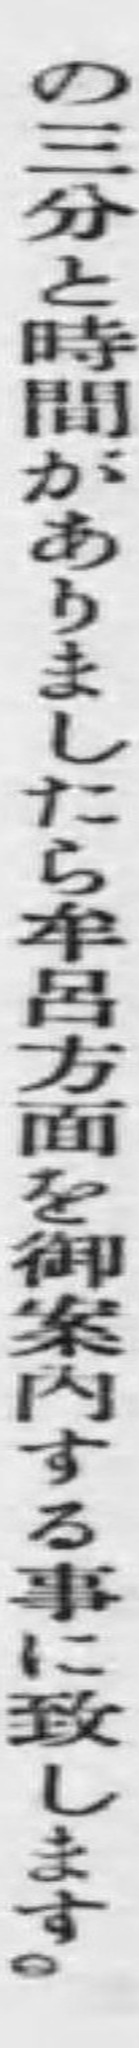の三分と時間がありましたら牟呂方面を御案内する事に致します。
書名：東三河道中記 : 豊橋市及其附近案内
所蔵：国立国会図書館 National Diet Library, JAPAN
